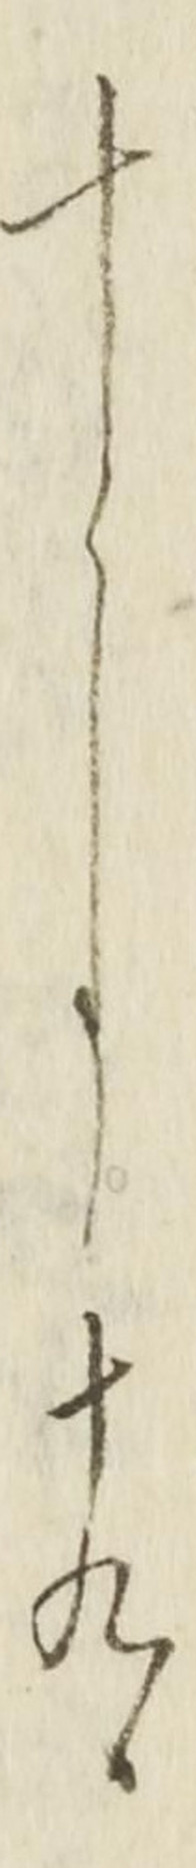十月十九日
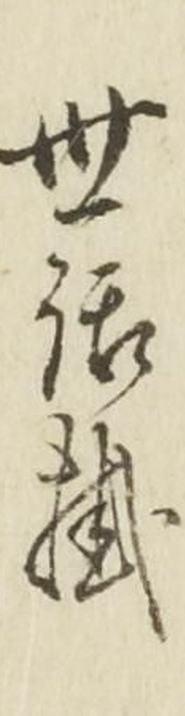世話掛
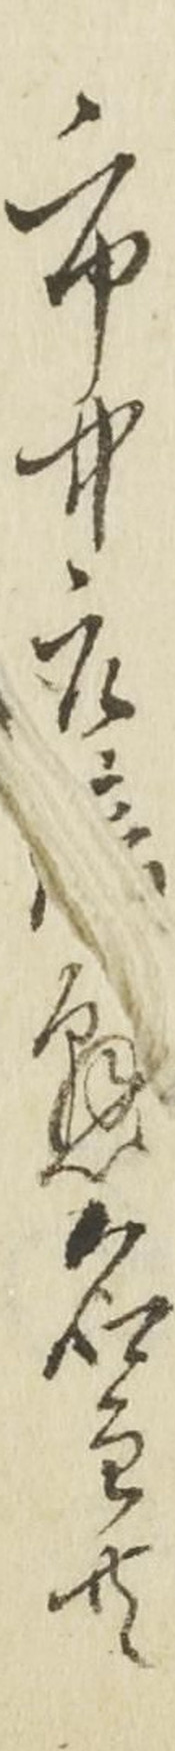市中取締懸名主共
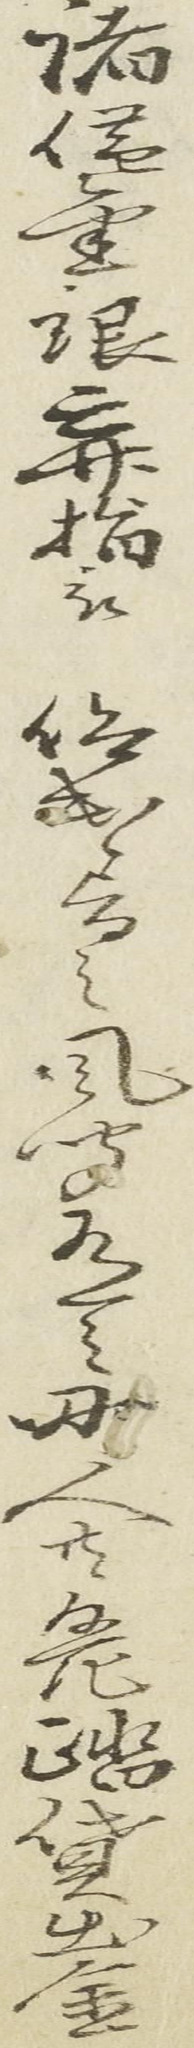諸借金銀棄捐被仰出候旨風聞有之町人共危踏貸出金
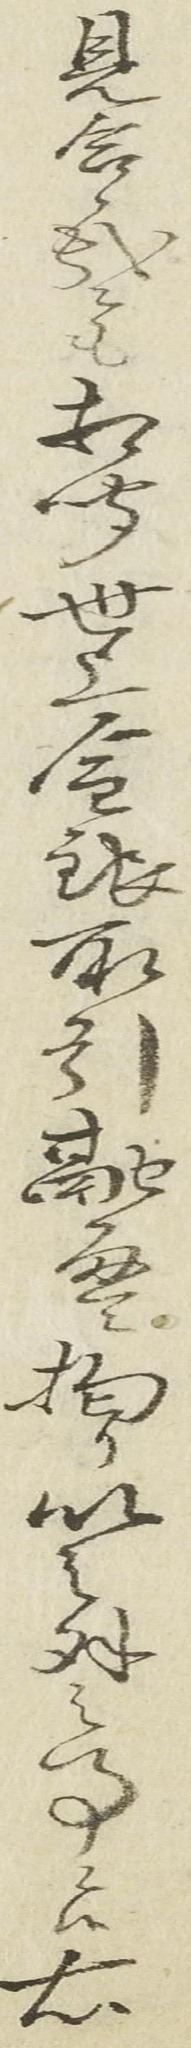見合候哉ニも相聞世上金銀取引融通二拘り以之外之事ニ候右
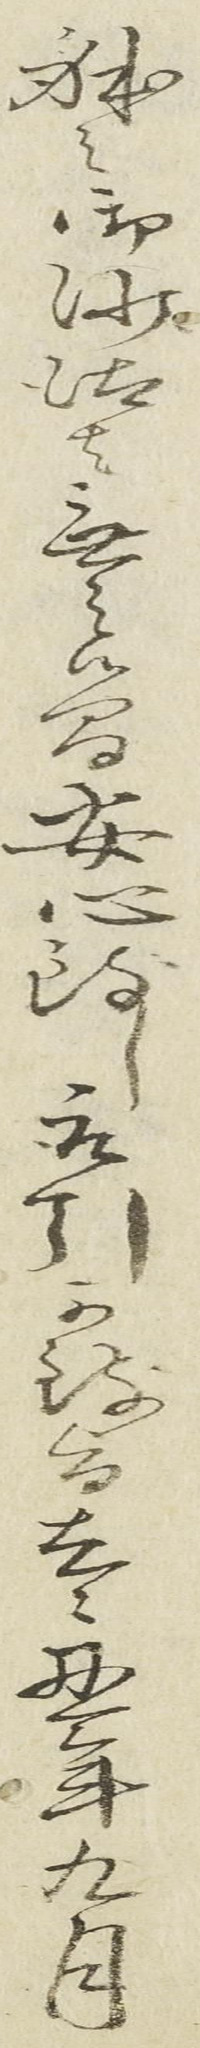躰之御沙汰は無之候間安心致し取引可致旨去々丑年九月
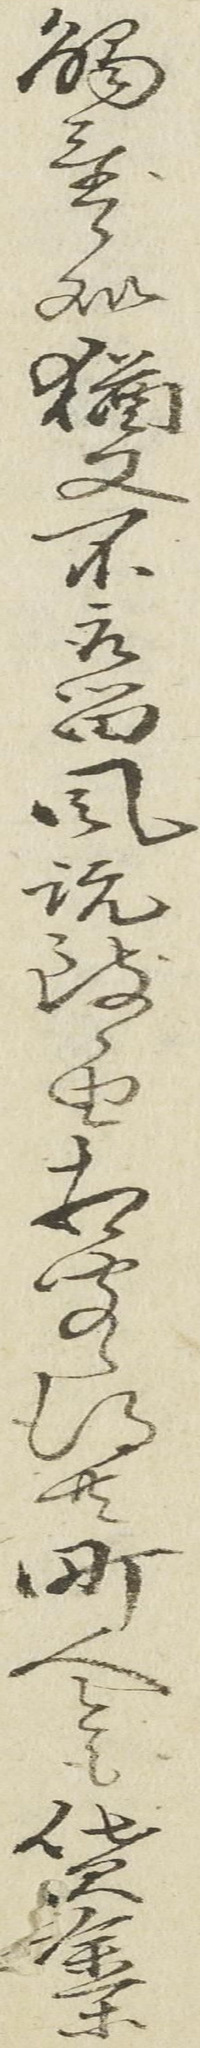触置候処猶又取留風説致候由相聞候得共町人とも貸金等
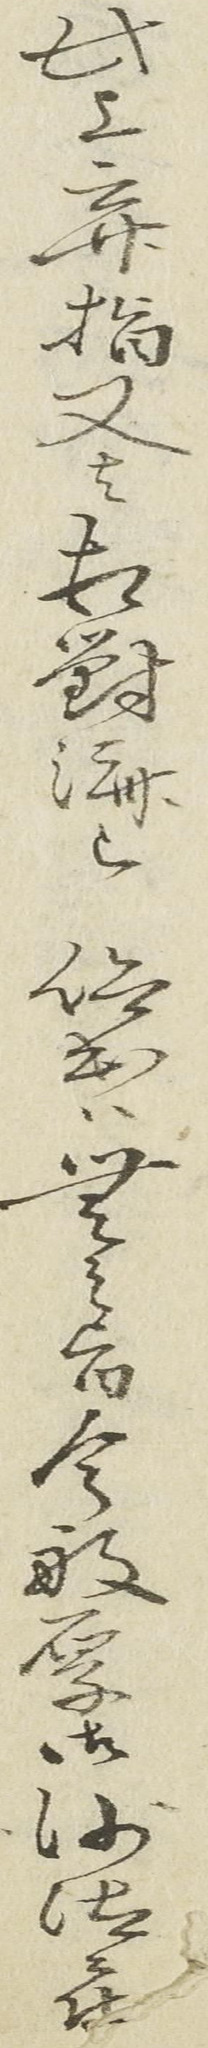此上棄捐又は相対済被仰出ハ無之旨今般厚御沙汰ニ付
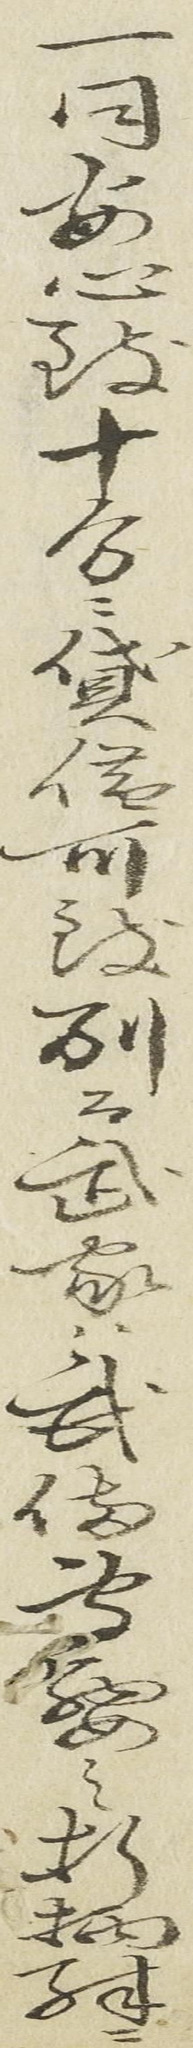一同安心致十分弐貸借可致別而武家ハ武備専要之折柄殊二
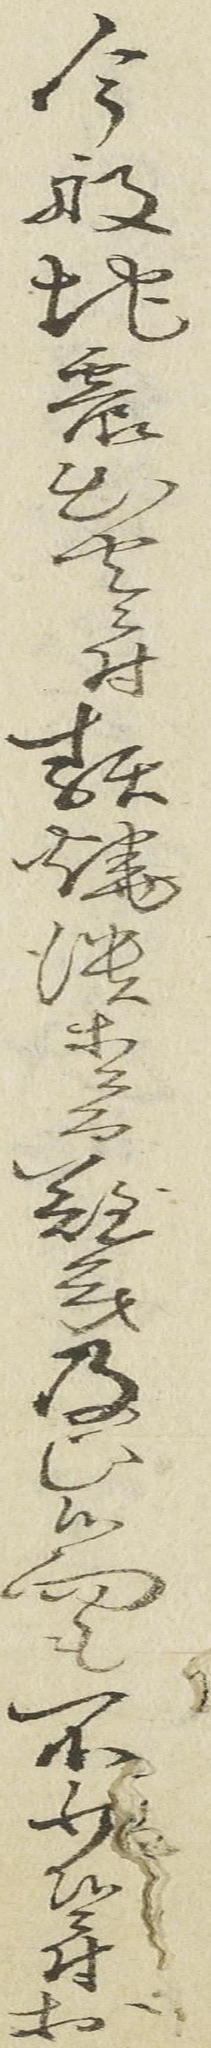今般地震出火ニ付類焼潰等ニ而難義及び候向も不少候ニ付於
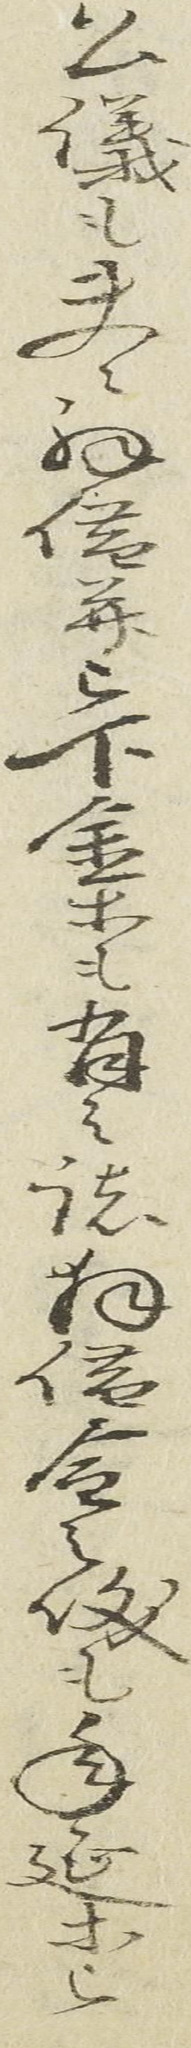公儀も夫々拝借幷被下金等も有之諸拝借金之儀も手延等被
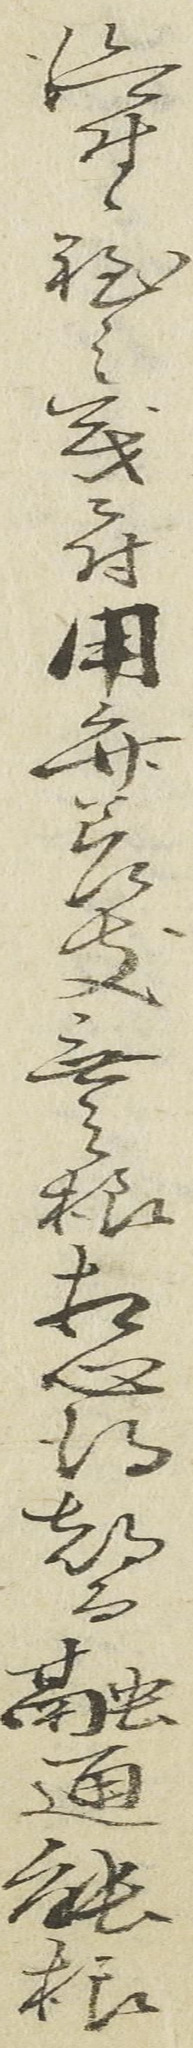仰付候程の義ニ付用弁差支無之様相心得都而融通罷様
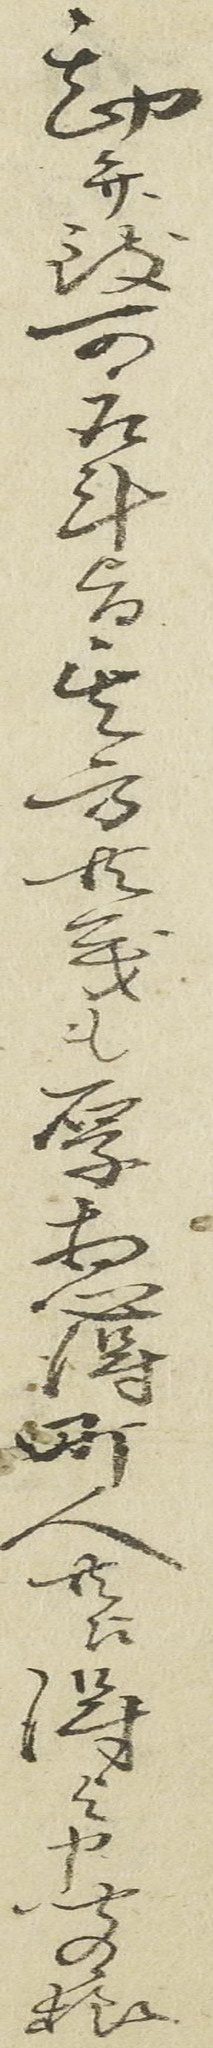勘弁致可取斗旨其方共義も厚相心得町人共え得と申聞候様

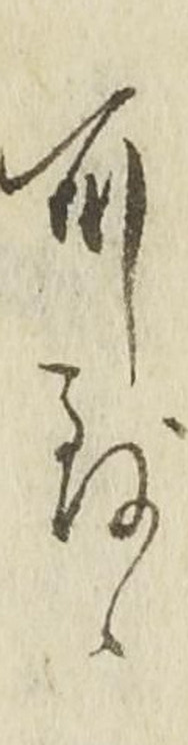可致候
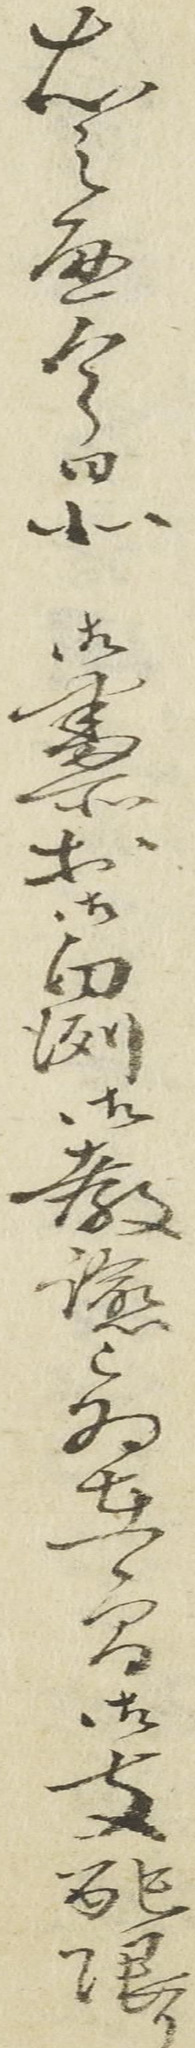右之通今日北御番所於御白州御教諭被為在候間御支配限り
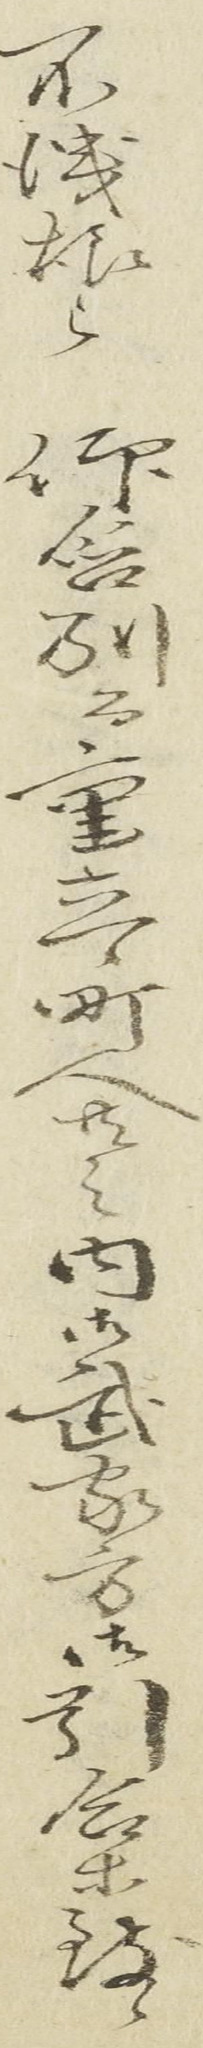不洩様被仰含別而重立候町人共之内御武家方御引合等致候
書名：安政二乙卯年十月二日大地震之事
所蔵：東京大学地震研究所図書室 Earthquake Research Institute Library, The University of Tokyo, JAPAN
